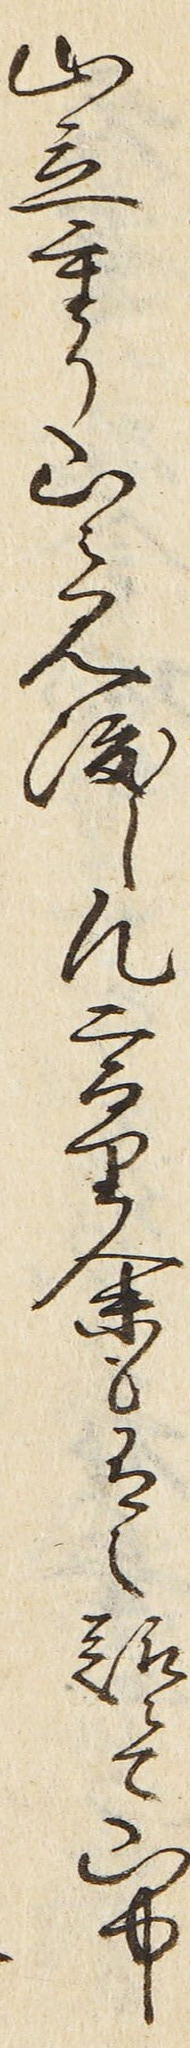山立重り山々見渡し凡二百里余も有之趣にて山中
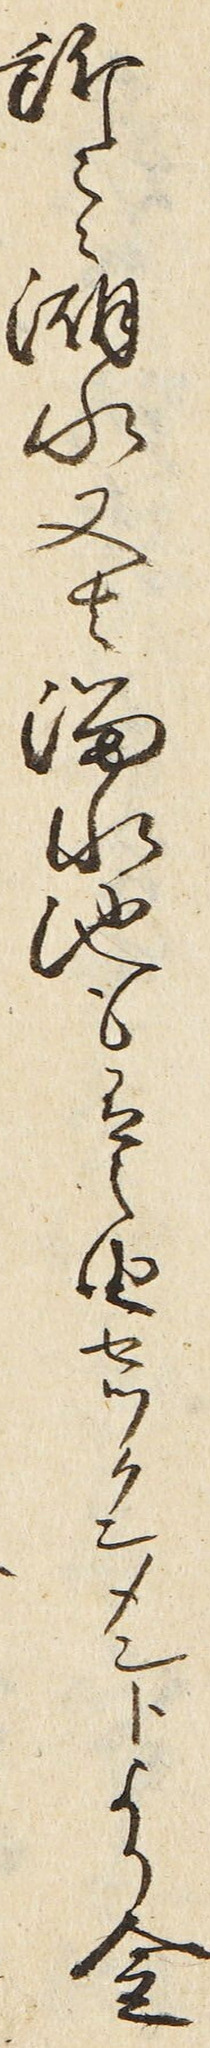所々に湖水又は溜水池も有之由セツクンメントより金
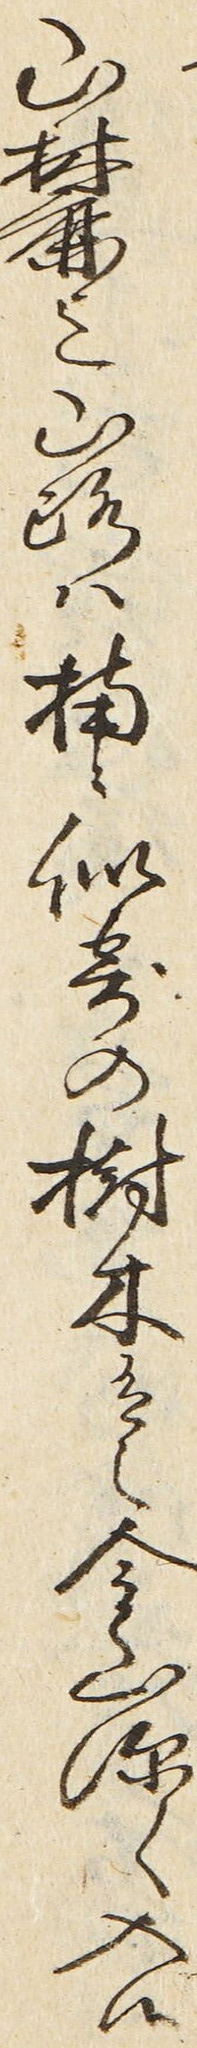山麓迄山路は楠に似寄の樹木有之金山深く入候
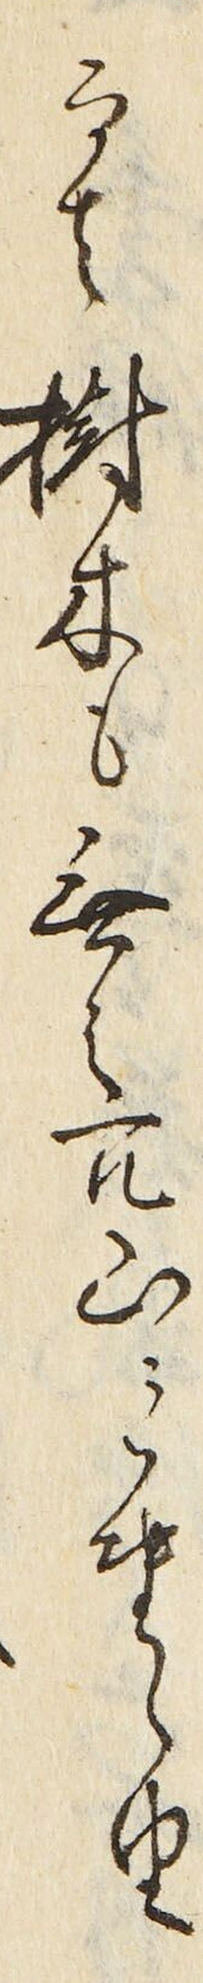而は樹木も無之兀山に御坐候由
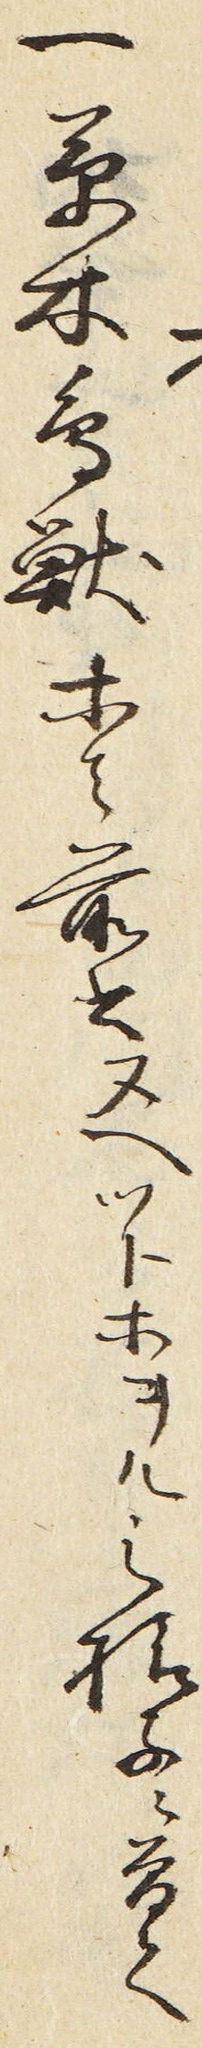一草木鳥獣等は前書ヌヘツトホヲル之様子に曽て

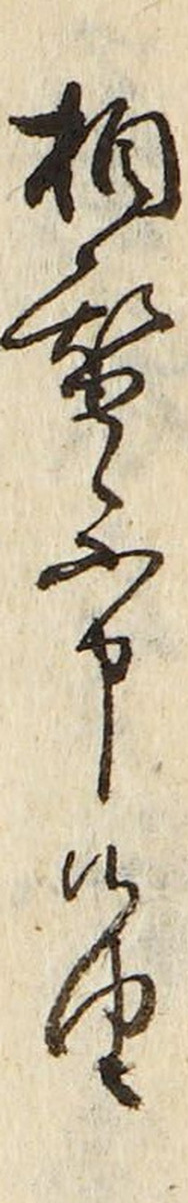相替不申候由
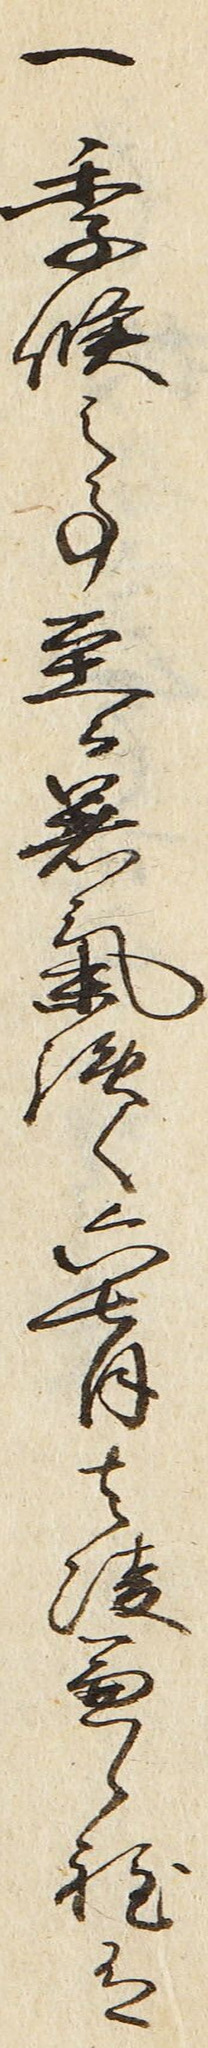一季候之事至而暑気強く六七月は凌兼候程有
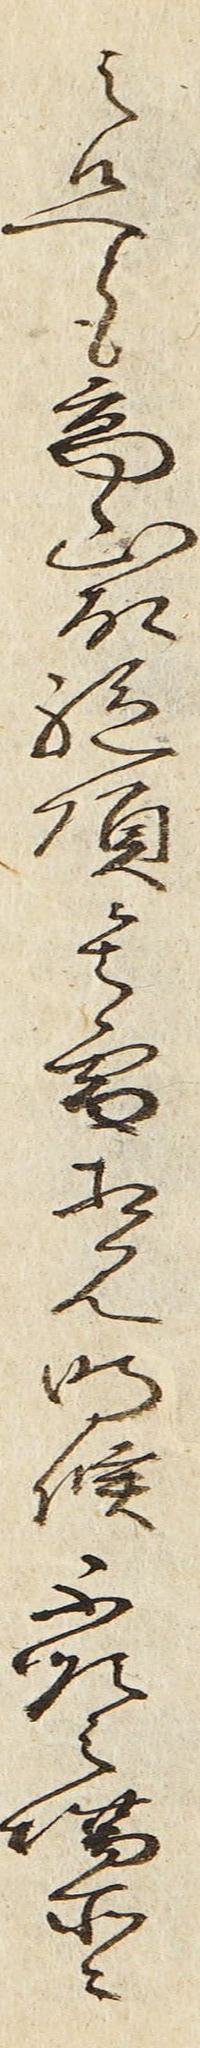之候へとも高山故絶頂には雪相見得候不順之場所に
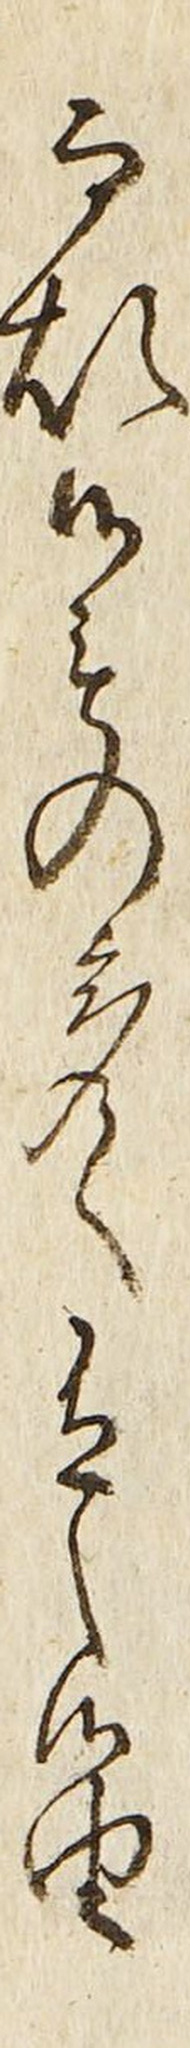而煩候もの多く有之候由
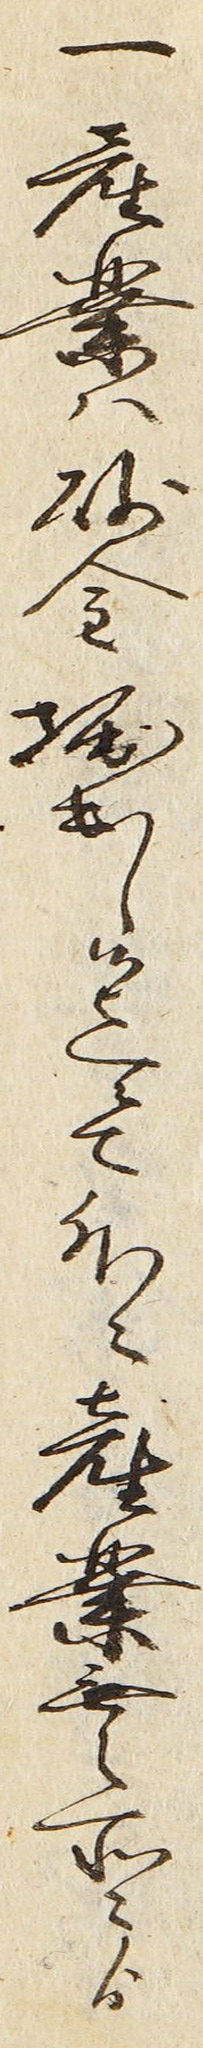一産業は砂金掘出し候迄にて外に産業無之所々ゟ
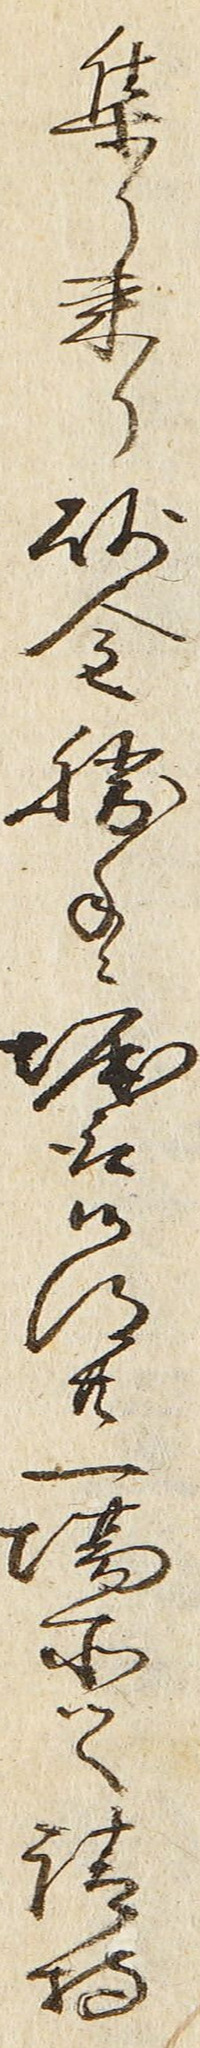集り来り砂金勝手に堀取候得共一場所ツヽ請持
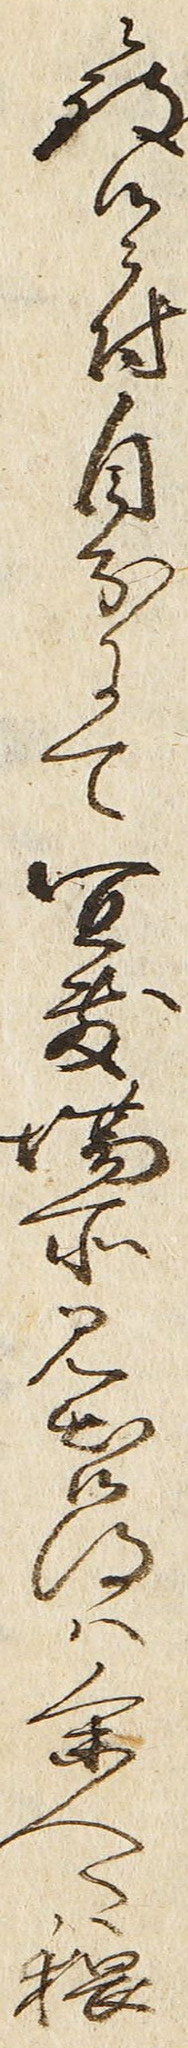に致候に付自分にて宜敷場所見出候得は余人へは猥
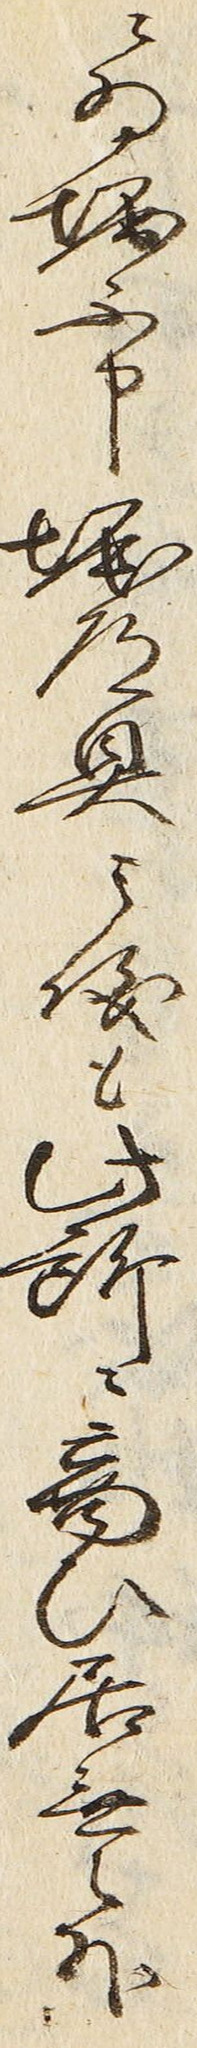に為掘不申掘道具之儀も此所に商ひ居無之外
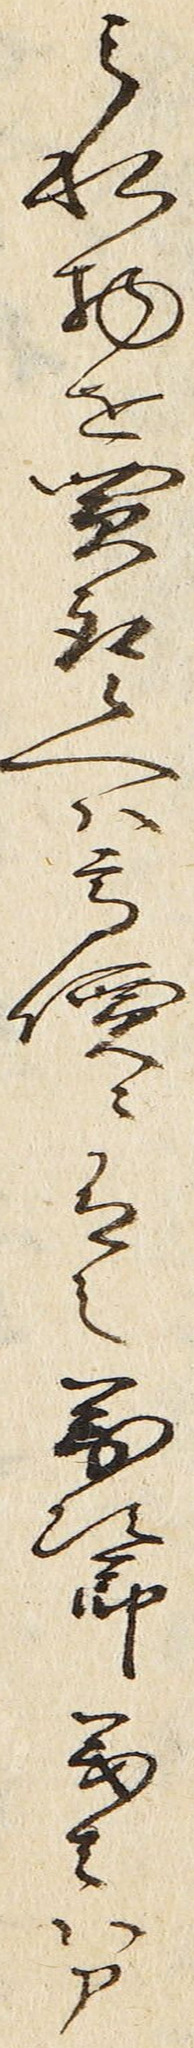之私物を買取候へは高価に有之万次郎義はハア
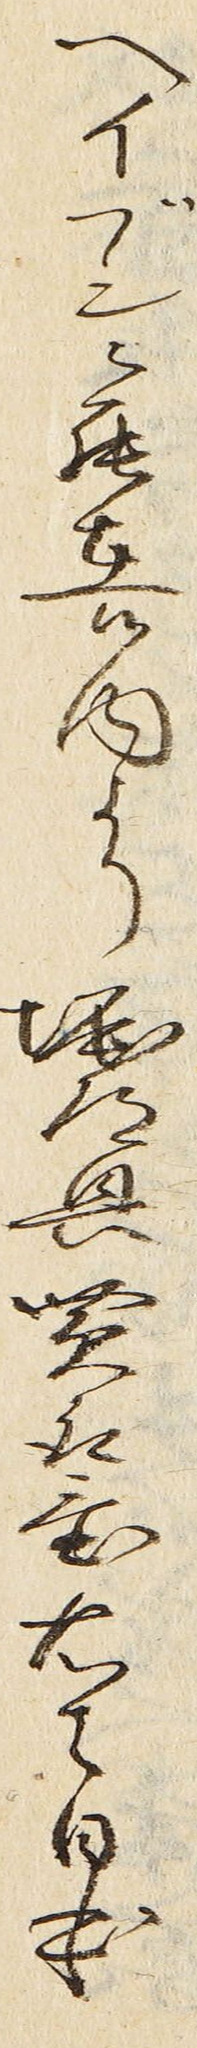へいブンに罷在候内より掘道具買取置右は日本
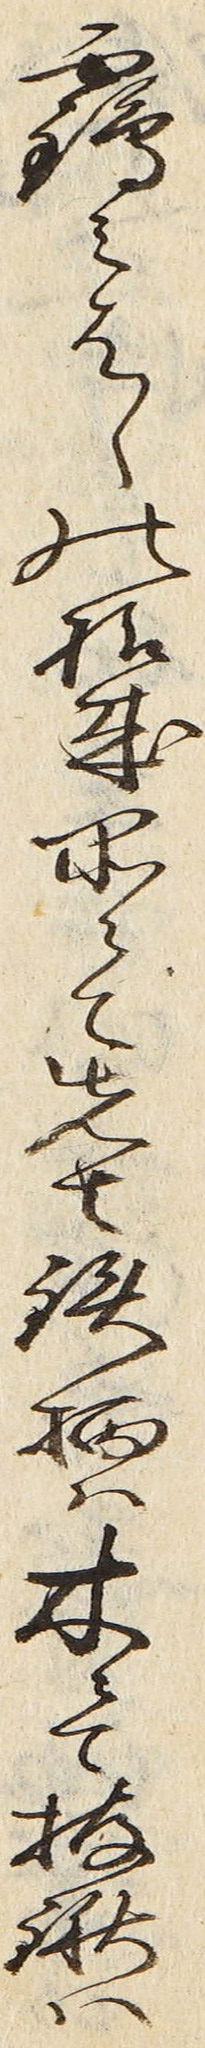鶴之はしの様成品にて先は鉄柄は木にて拵鍬は
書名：土佐中浜万次郎漂流記
